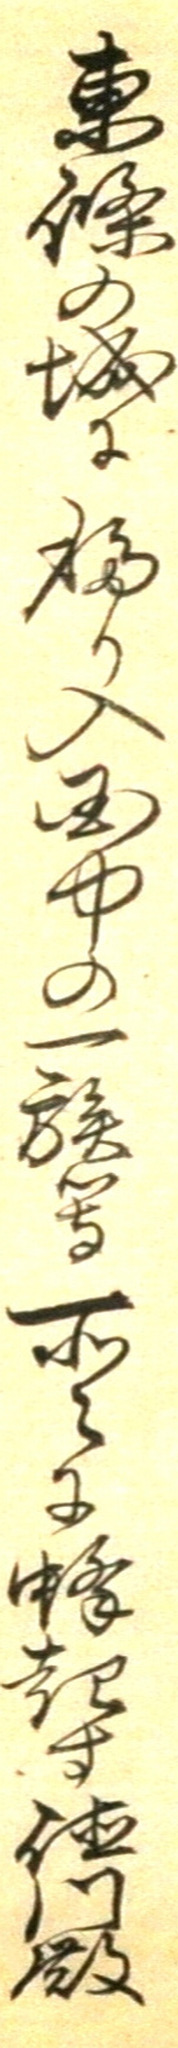東條の城に移り入国中の一族等所々に蜂起す徳川殿
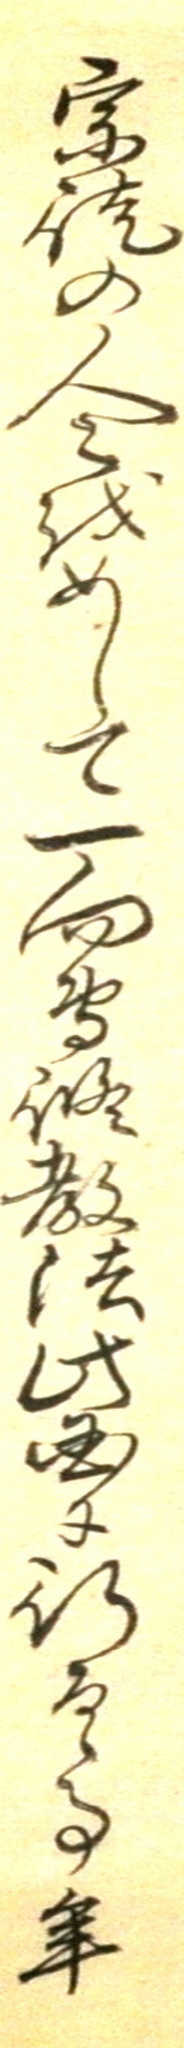宗徒の人々をめして一向専修教法此国に行るゝ事年
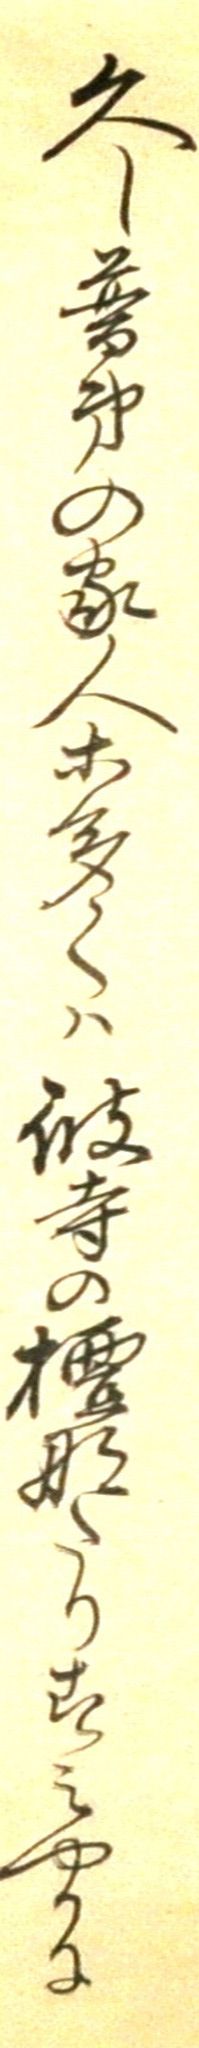久し普第の家人等多くは彼寺の檀那たりすみやかに
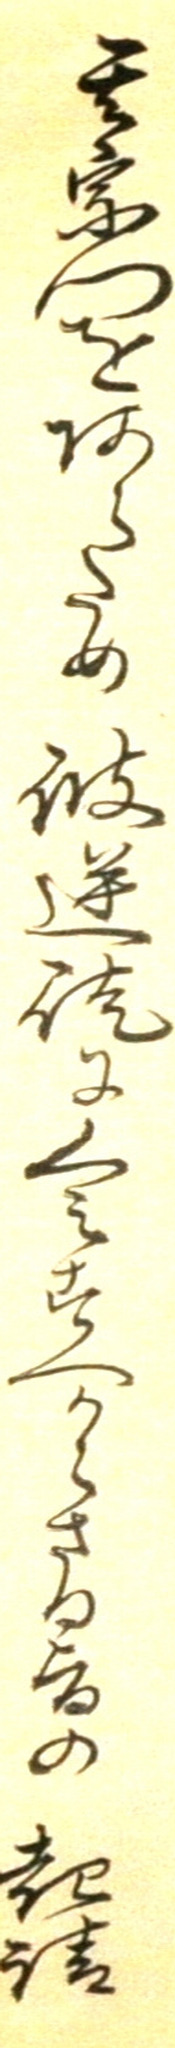其宗門をあらため彼逆徒にくみすへからさる旨の起請
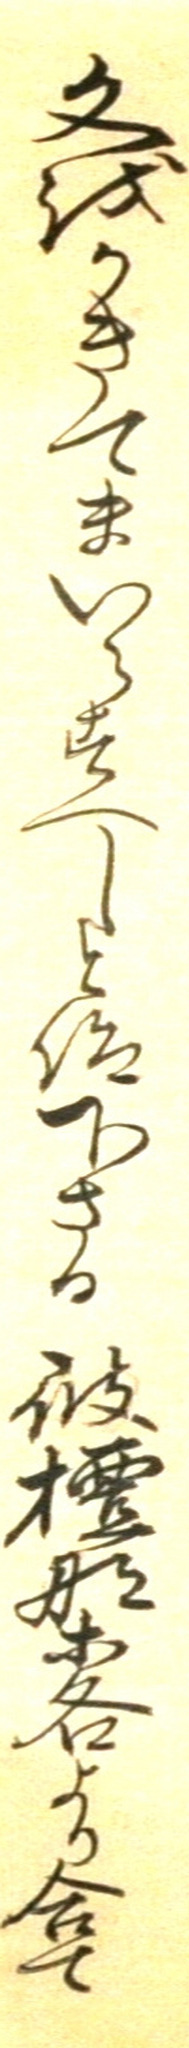文をかきてまいらすへしと仰下さる彼檀那等各より合て
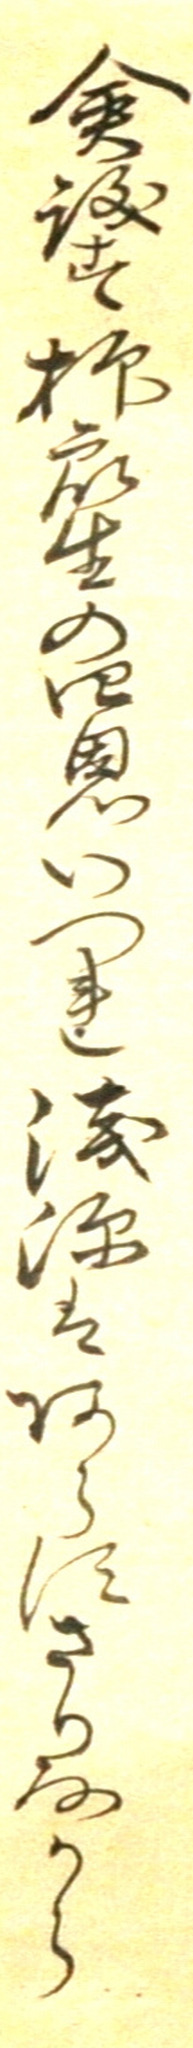僉議す抑衆生の四恩いつれ浅深はあらすさりなから
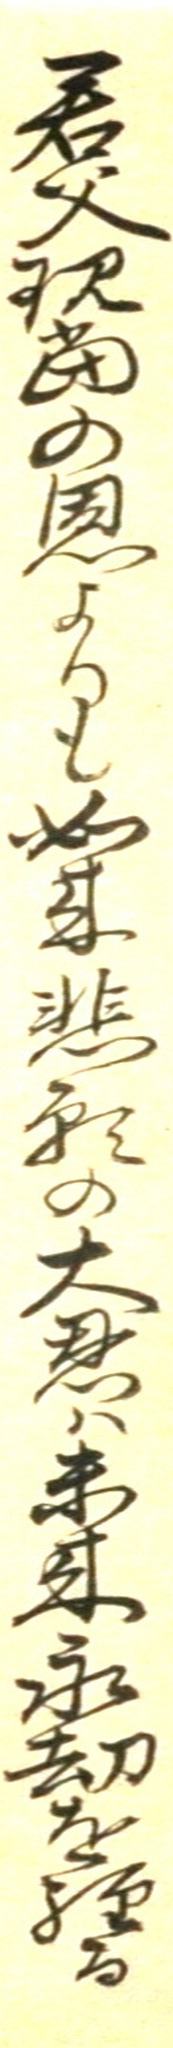君父現当の恩よりも如来悲願大恩は未来永劫を経る
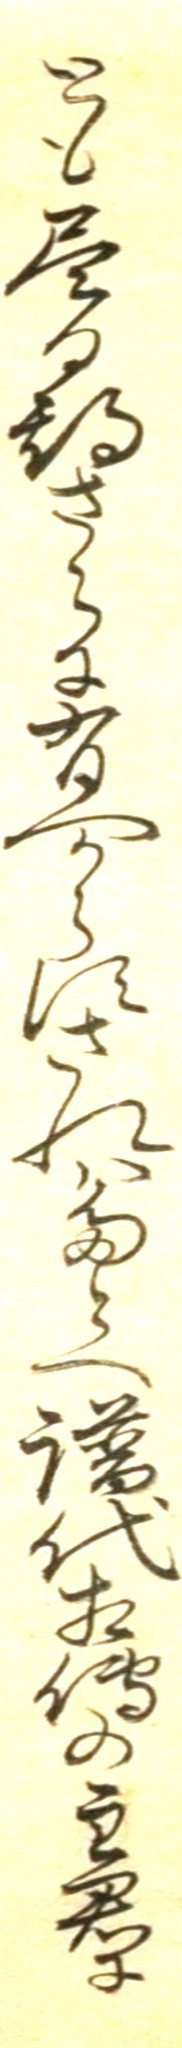とも尽る期さらに有へからすされはたとへ譜代相伝の主君に
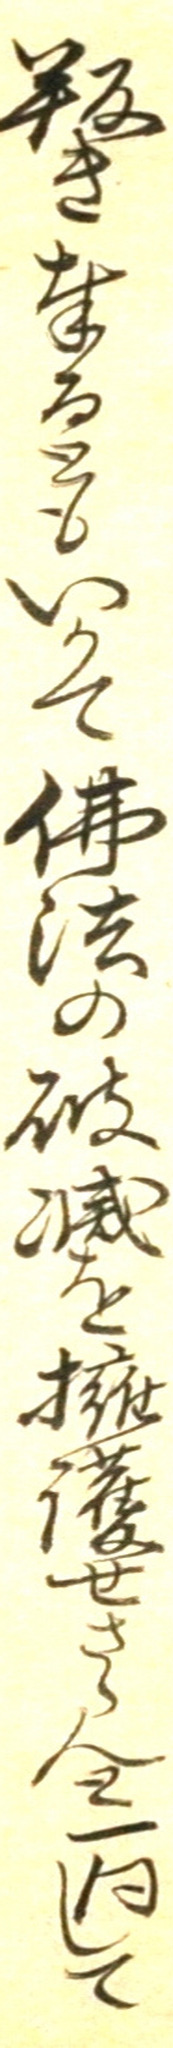叛き奉るともいかて仏法の破滅を擁護せさらんと一同して
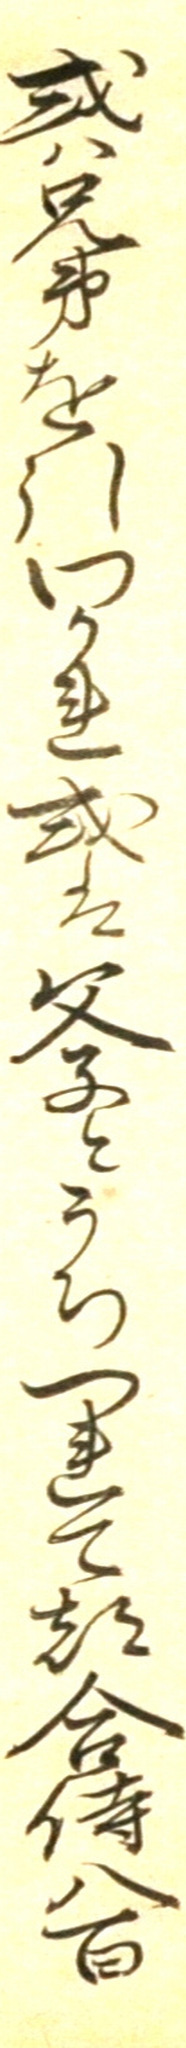或は兄弟を引わかれ或は父子とうちつれて都合侍八百
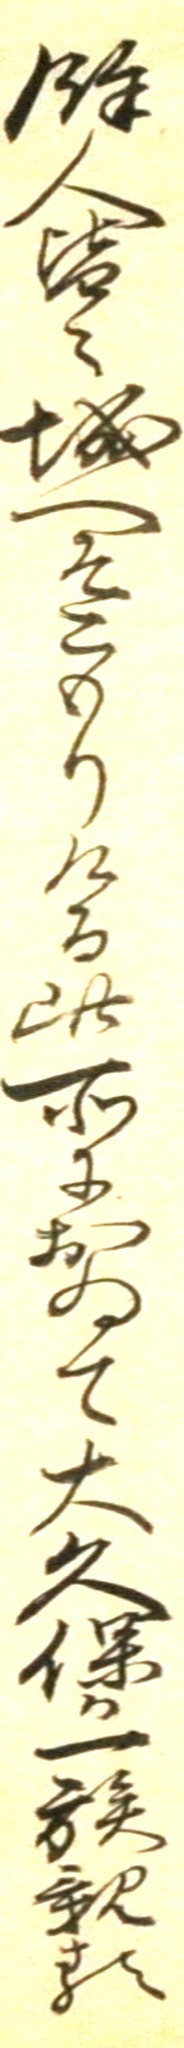余人皆々城へそこもりける此所におゐて大久保か一族親類
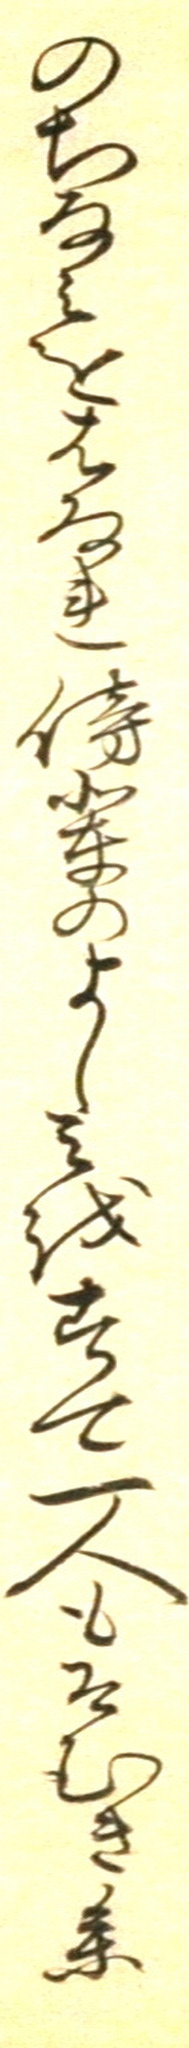のちなみをはなれ傍輩のよしみをすて一人もそむき参
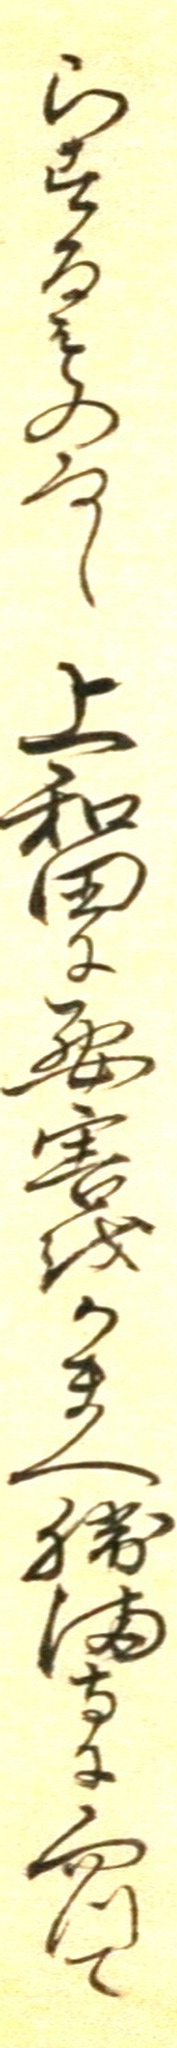らするものなし上和田に要害をかまへ勝満寺に向つて
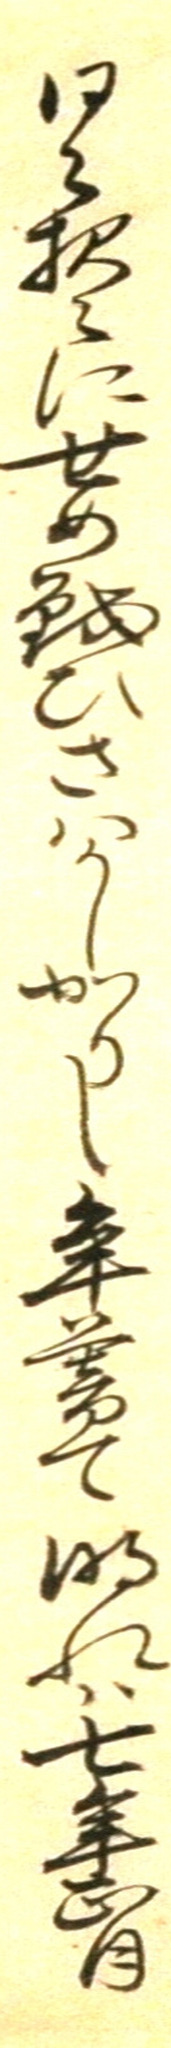日々夜々にせめ戦ひさはかしかりし年暮て明れは七年正月
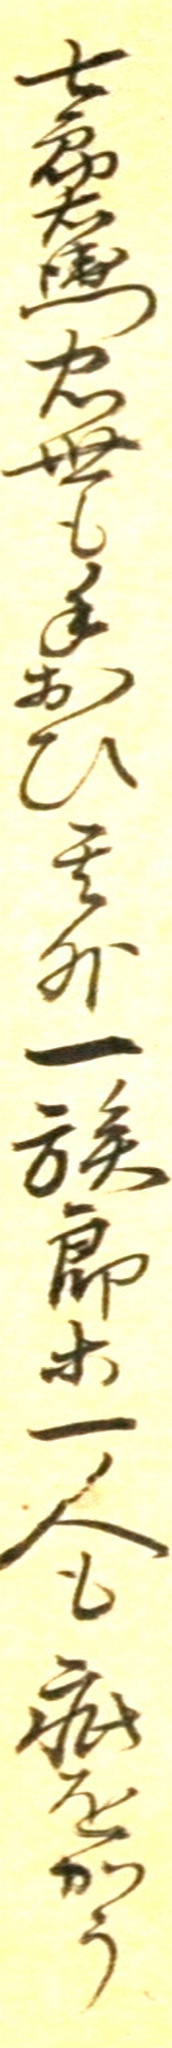七郎右衛門忠世も手おひ其外一族郎等一人も疵をかう

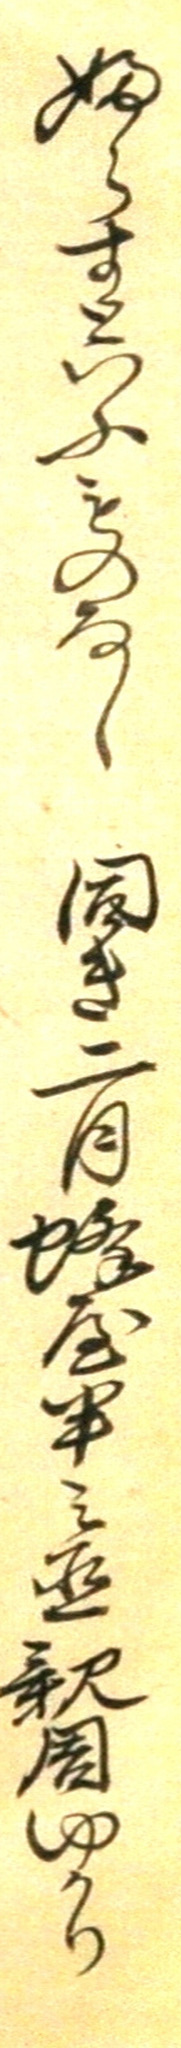ふらすといふものなし同き二月蜂屋半之丞親周ゆかり
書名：藩翰譜（四・中）
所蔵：伊那市立高遠町図書館・合同会社AMANE
